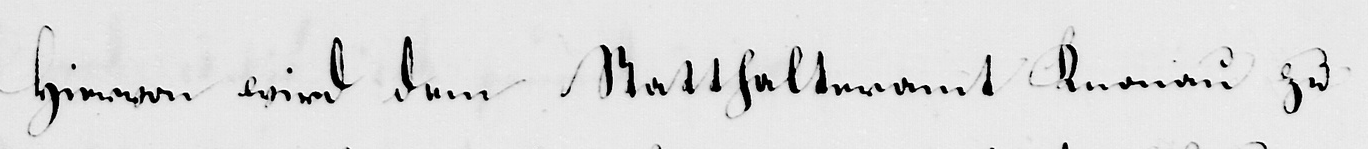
Hiervon wird dem Statthalteramt Knonau zu
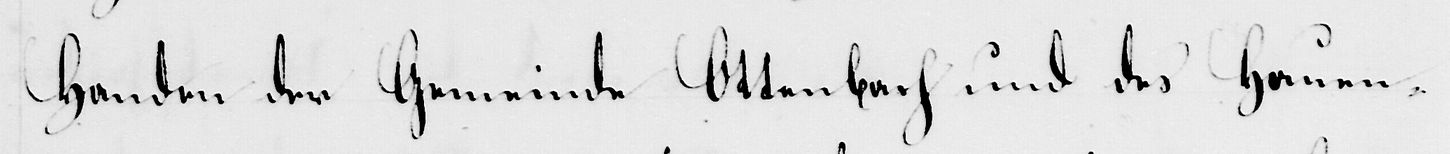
Handen der Gemeinde Ottenbach und des Hauen¬
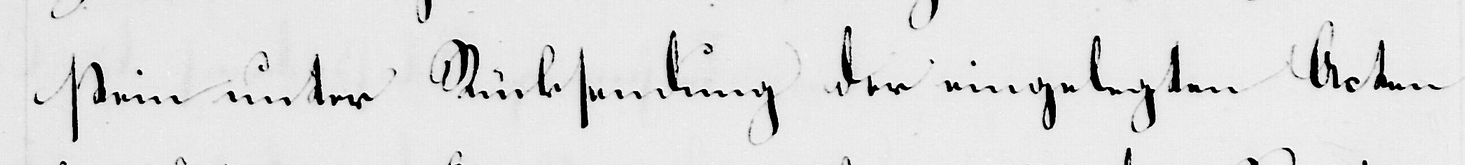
stein unter Rücksendung der eingelegten Acten
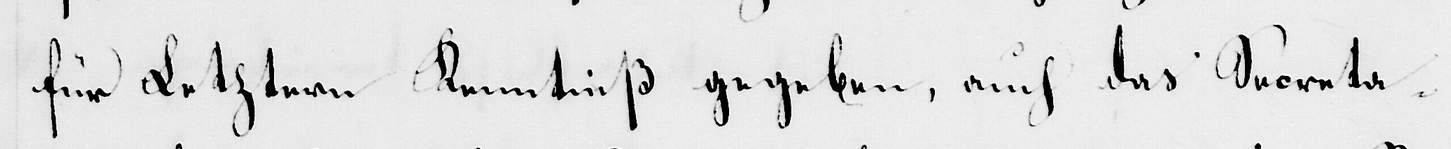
für Letztern Kenntniß gegeben, auch das Secreta¬
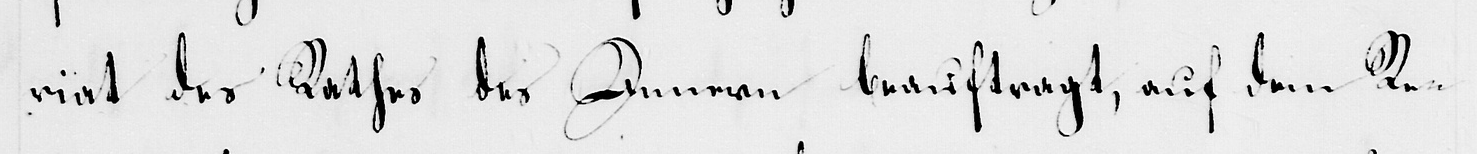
riat des Rathes des Innern beauftragt, auf dem Re¬
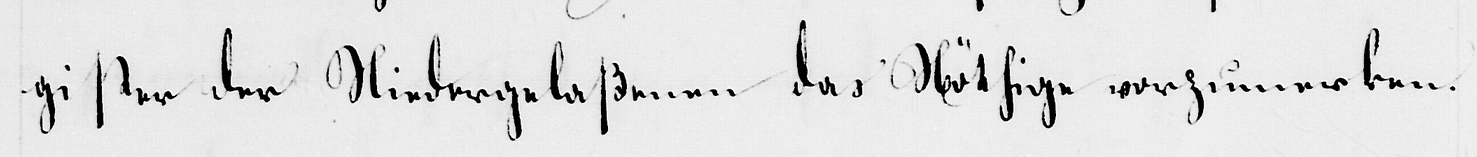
gister der Niedergelaßenen das Nöthige vorzumerken.
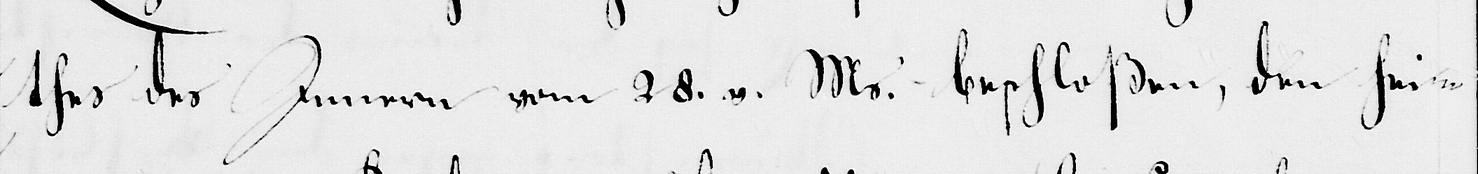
thes des Innern vom 28. v. Ms. beschloßen, den hei¬
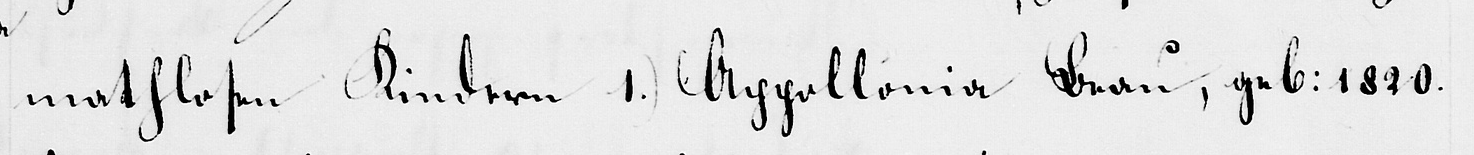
mathlosen Kindern 1.) Appollonia Beau, geb: 1820.
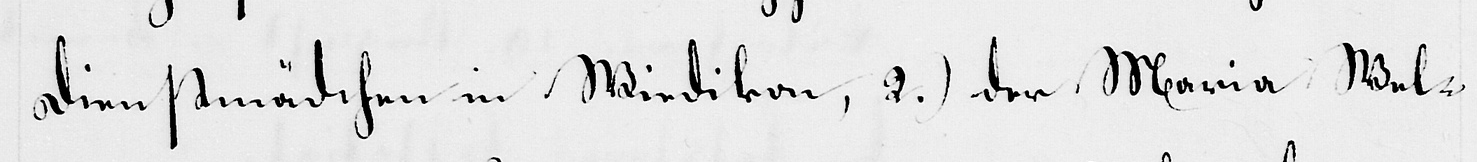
Dienstmädchen in Wiedikon, 2.) der Maria Wel¬
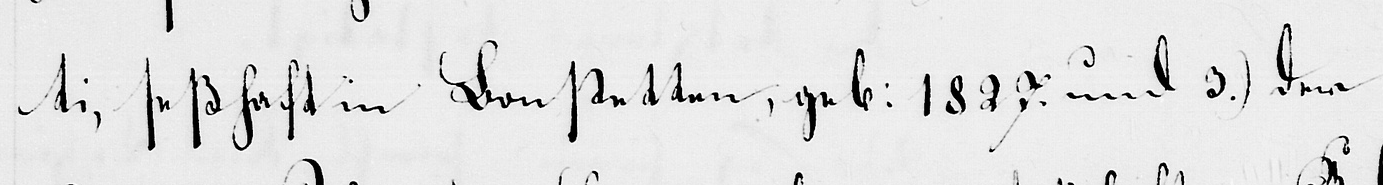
ti, seßhaft in Bonstetten, geb: 1827. und 3.) der
